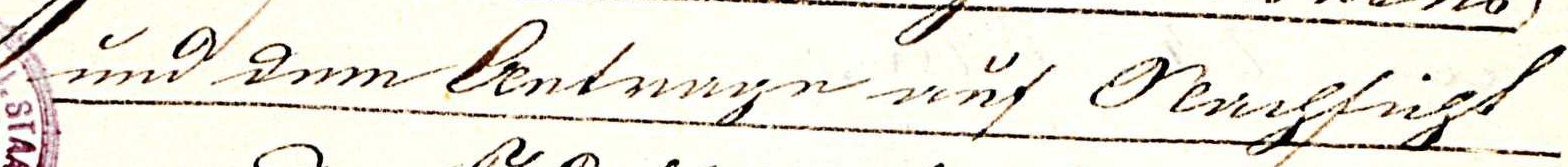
und dem Antrage auf Nachsicht
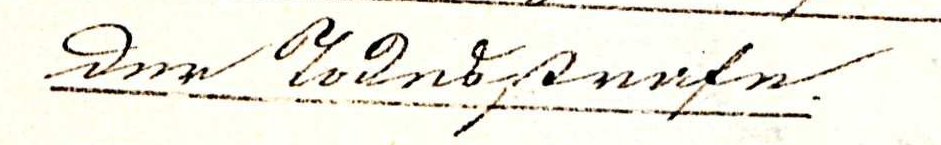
der Todesstrafe.
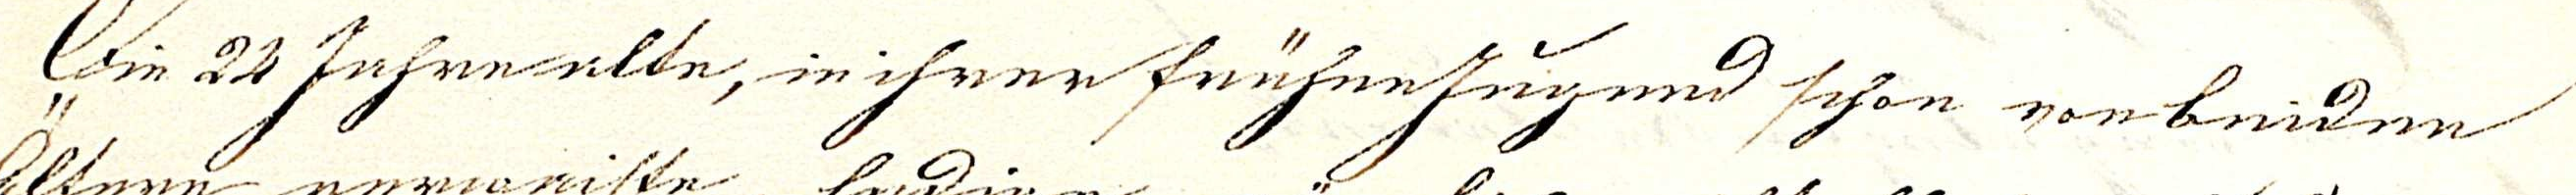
Die 22 Jahre alte, in ihrer frühen Jugend schon von beiden
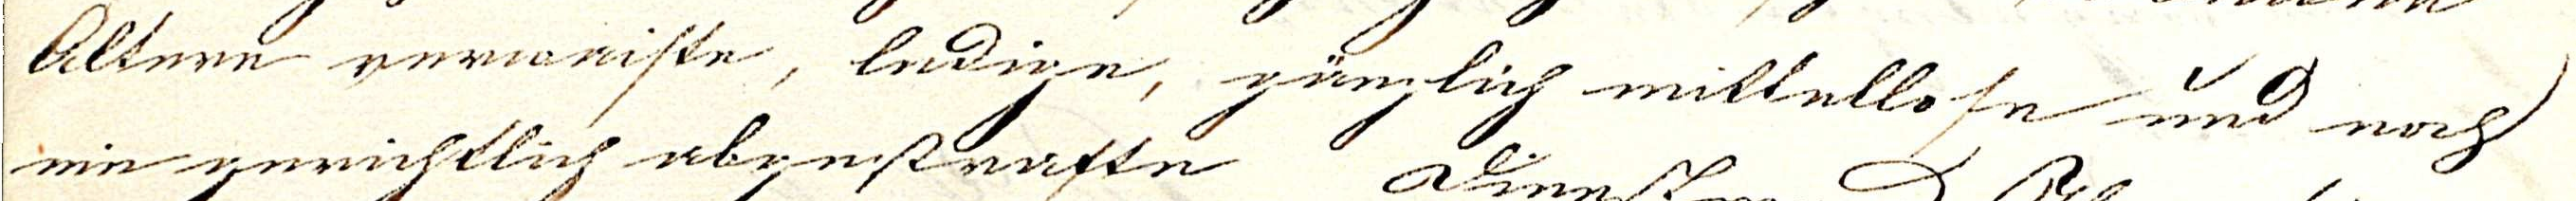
Ältere verwaiste, ledige, gänzlich mittellose und noch
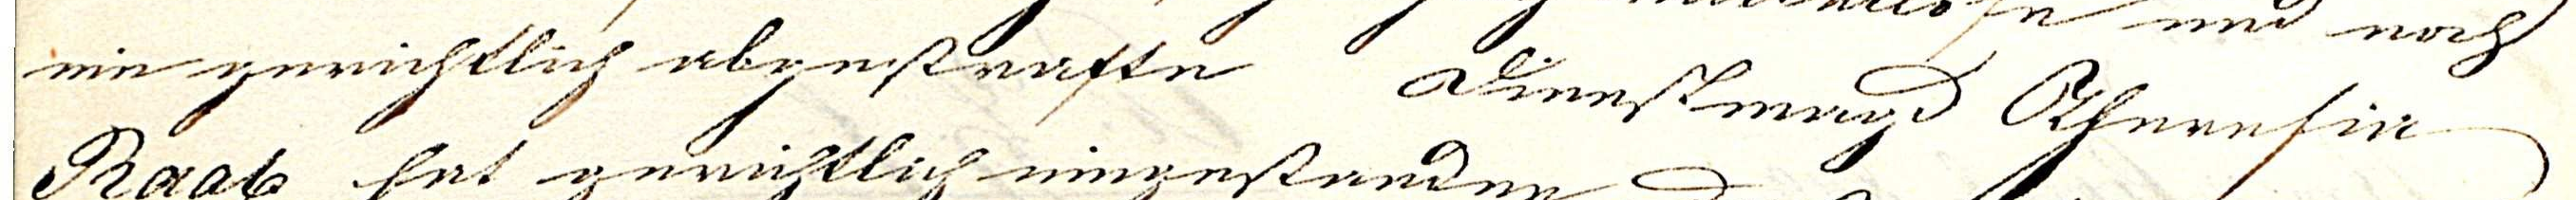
nie gerichtlich abgestrafte Dienstmagd Theresia
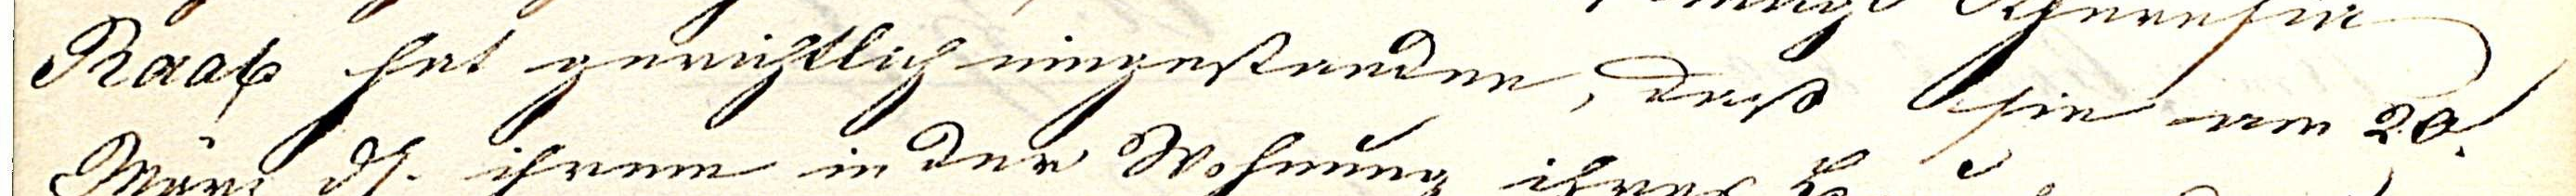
Raab hat gerichtlich eingestanden, daß sie am 20.
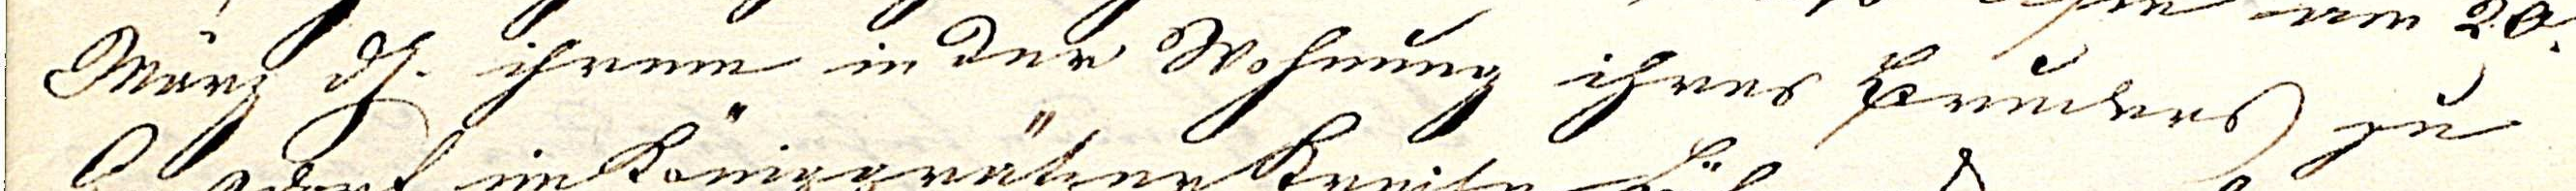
März xx ihrem in der Wohnung ihres Bruders zu
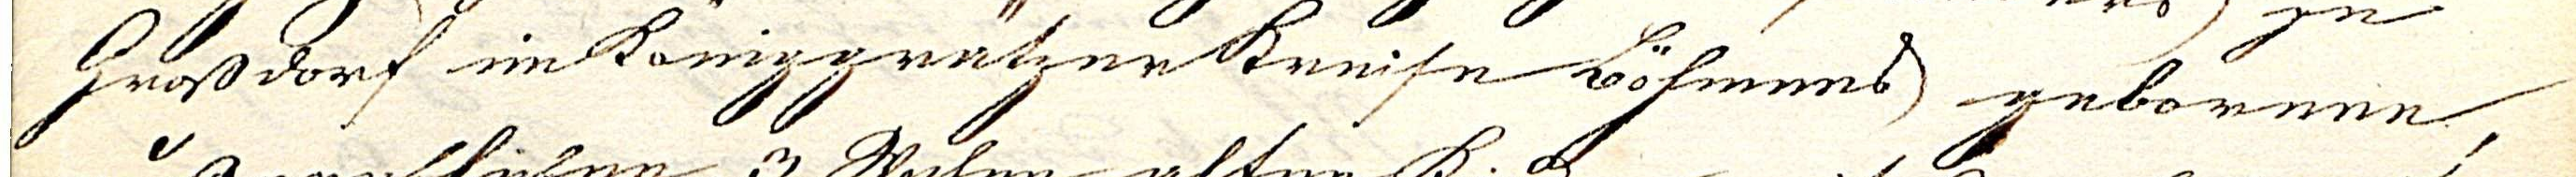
Großdorf im Königgrätzer Kreise Böhmens geborene,
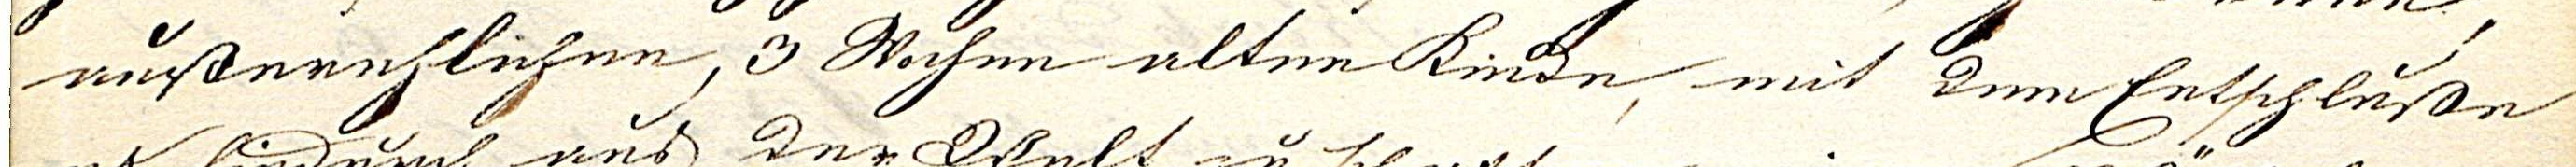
außerehlichen, 3 Wochen alten Kinde, mit dem Entschluße
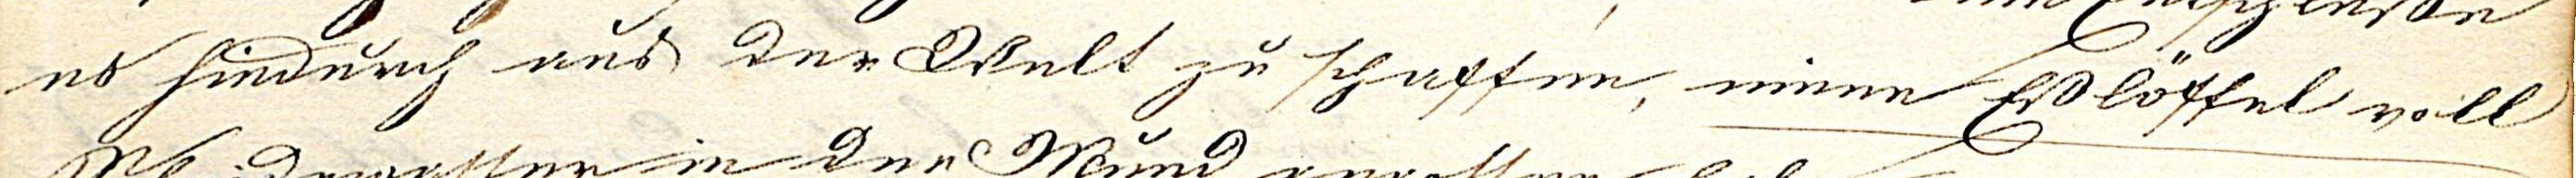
es hindurch aus der Welt zu schaffen, einen Eslöffel voll
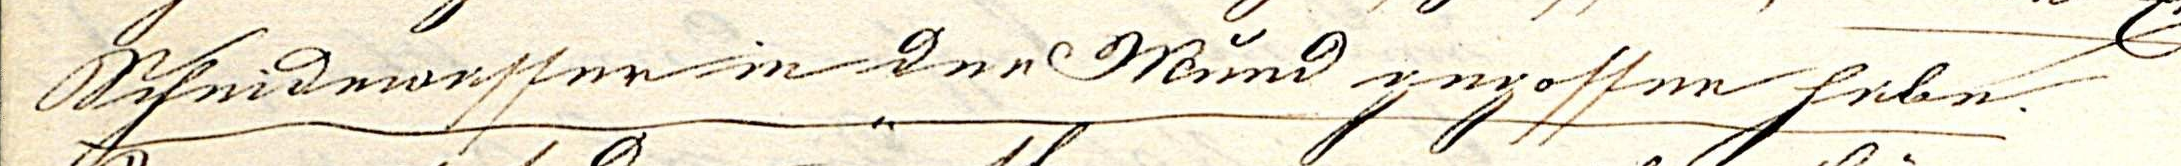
Schnidewesser in der Mund gegossen habe.
